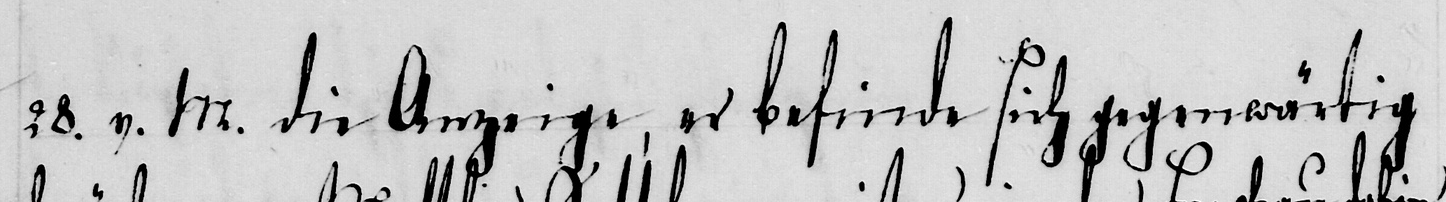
28. v. M. die Anzeige, er befinde sich gegenwärtig
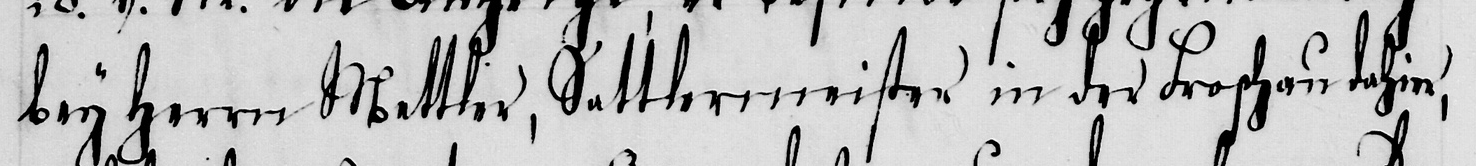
bey Herrn Mettler, Sattlermeister in der Froschau dahin,
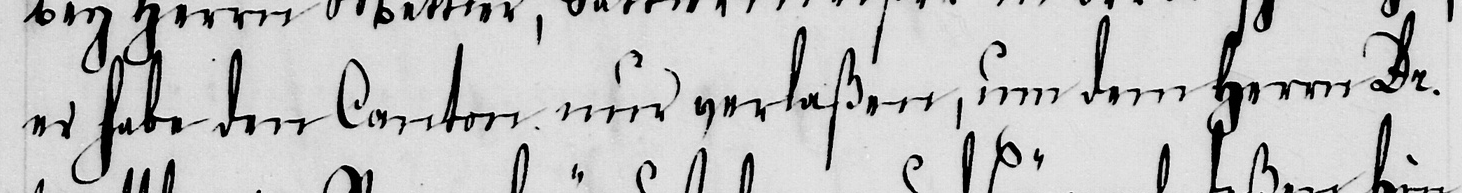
er habe den Canton nur verlaßen, um dem Herrn Dr.
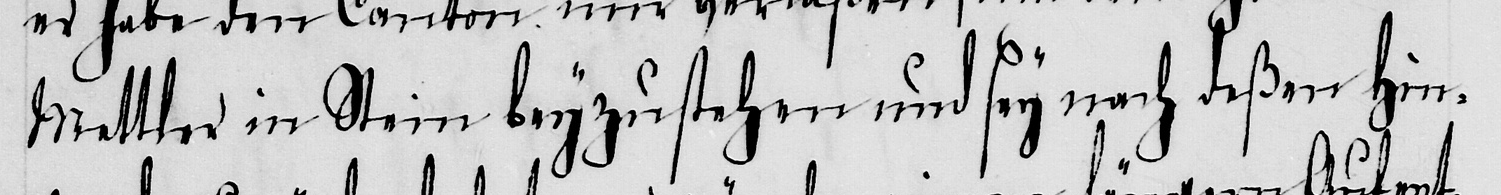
Mettler in Stein beyzustehen und sey nach deßen Hin¬
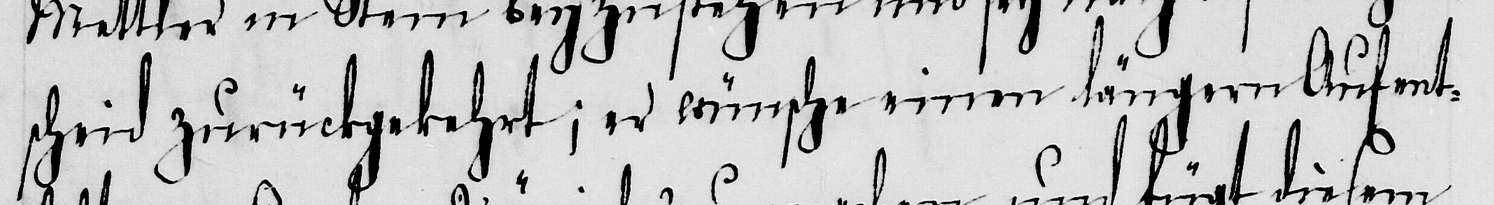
scheid zurückgekehrt; er wünsche einen längern Aufent¬
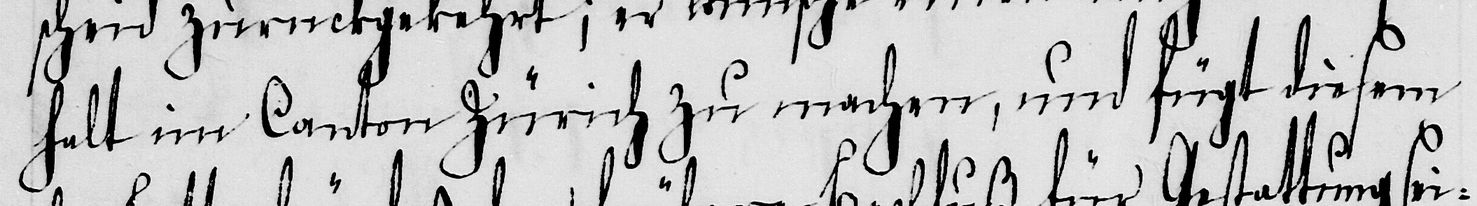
halt im Canton Zürich zu machen, und fügt diesem
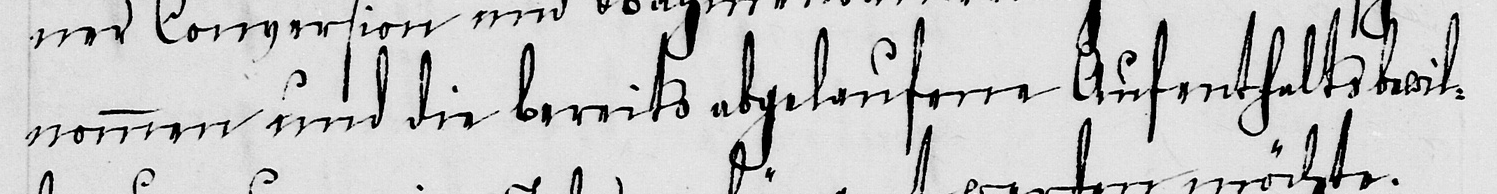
nommen und die bereits abgelaufene Aufenthaltsbewil¬
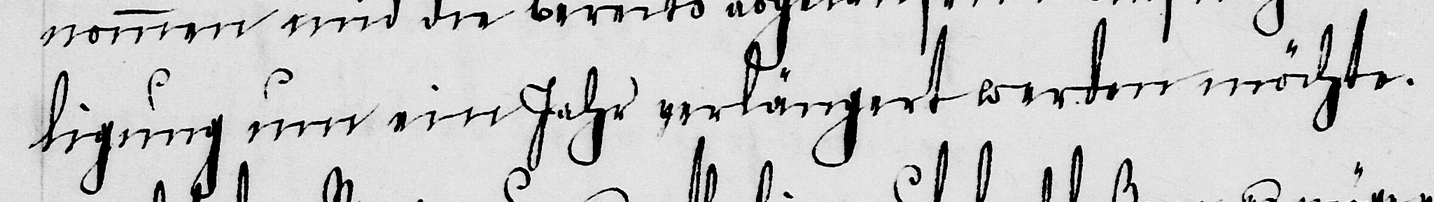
ligung um ein Jahr verlängert werden möchte.
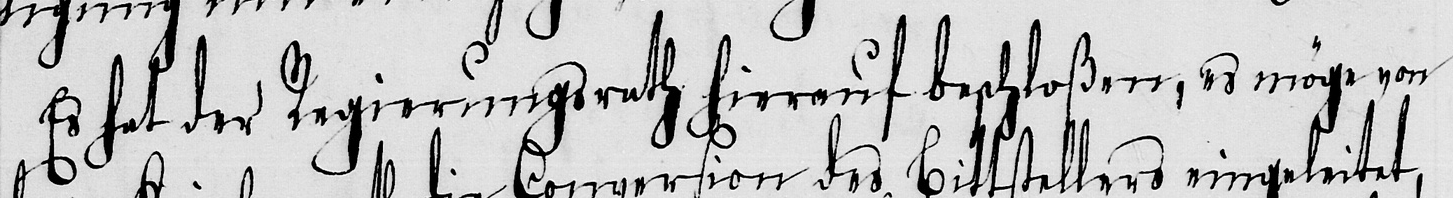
Es hat der Regierungsrath hierauf beschloßen, es möge von
